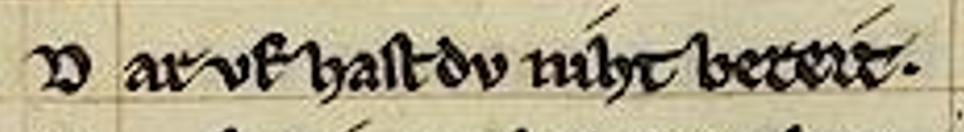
Dar vf haſt dv niht bereit.
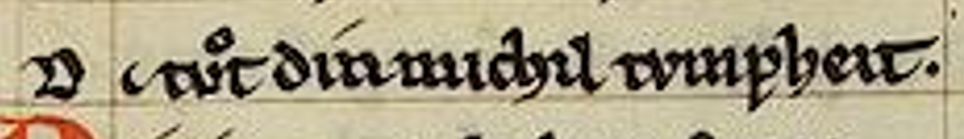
D(az) tv°ot din michil tvmpheit.
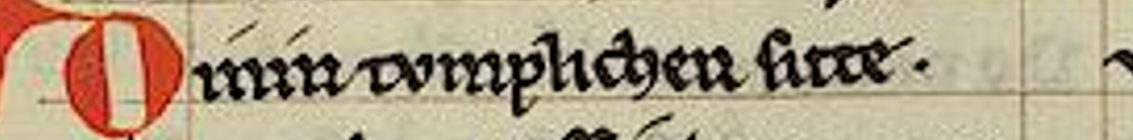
*Dinin tvmplichen ſitte.
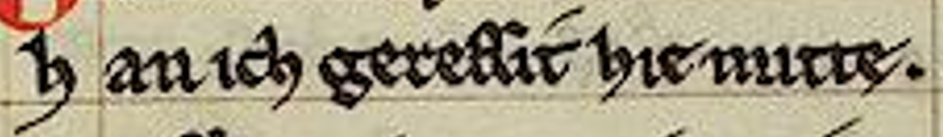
Han ich gerefſit hie mitte.
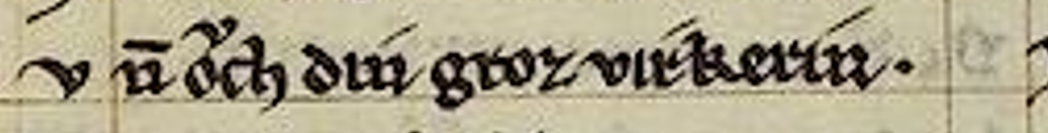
Vn(d) o°vch din groz virkerin.
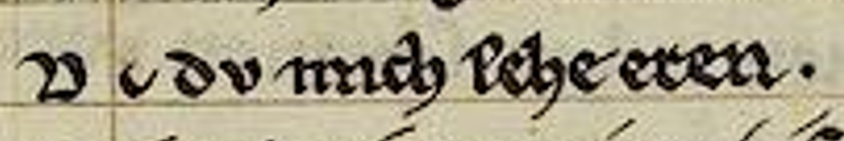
D(az) dv mich ſehe eren.
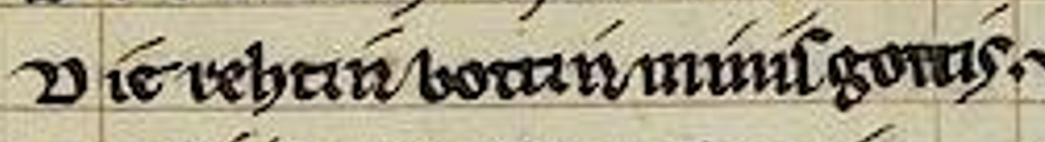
Die rehtin bottin miniſ gottis.
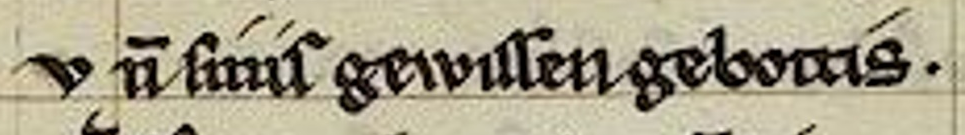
Vn(d) ſiniſ gewiſſen gebottis.
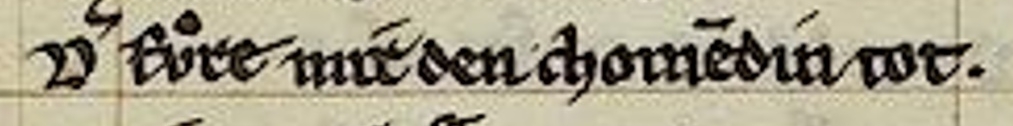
D(er) fv°ore mir den chome(n)din tot.
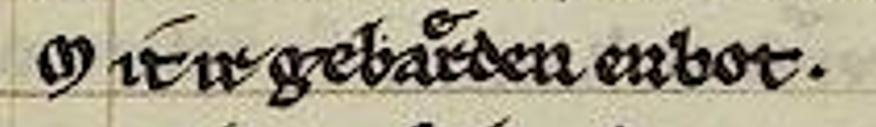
Mit ir geba°(e)rden enbot.
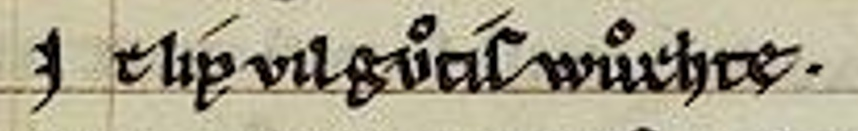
Ir lip vil gv°otiſ wu°orhte.
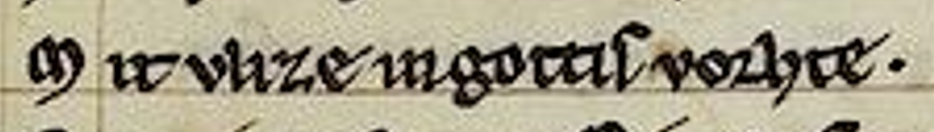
Mit vlize in gottiſ vorhte.
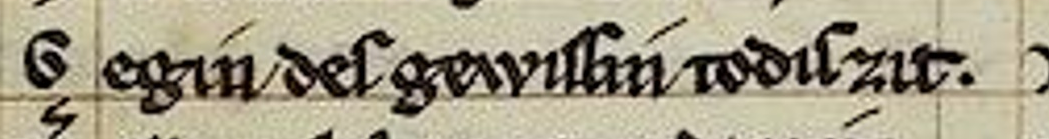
Gegin deſ gewiſſin todiſ zit.
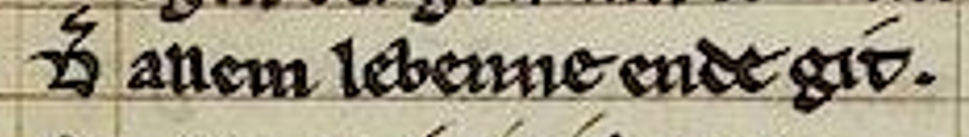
D(er) allem lebenne ende git.
